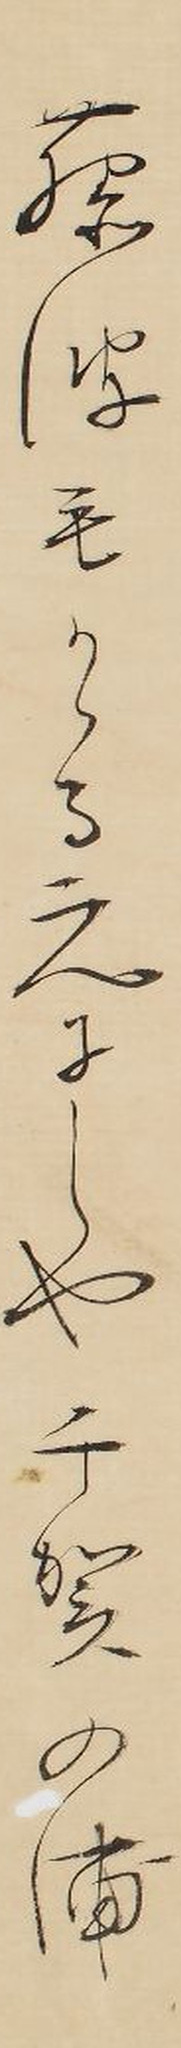藤波もかゝるえにしや千賀の浦
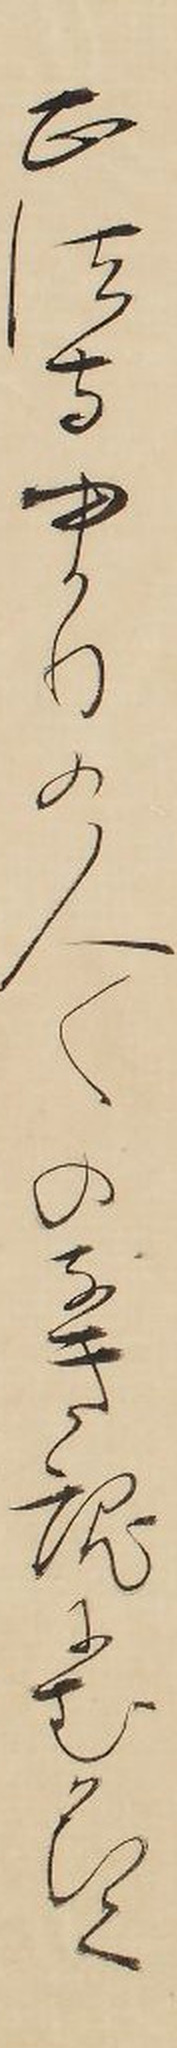正法寺ゆかりの人〳〵のなき魂にむかひて
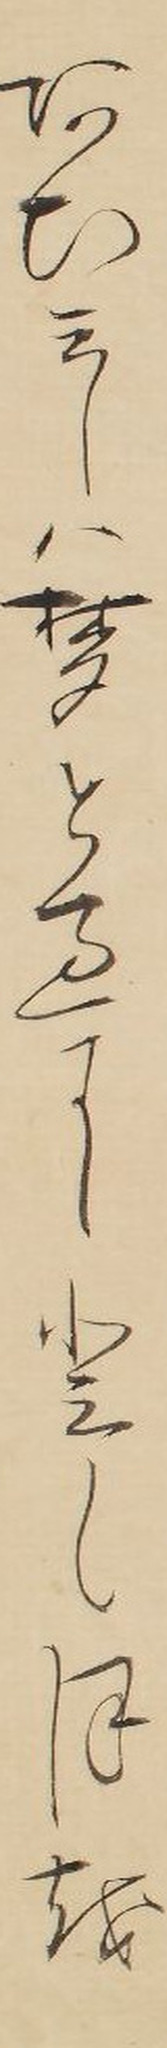あひみしは夢と過にしとし月を
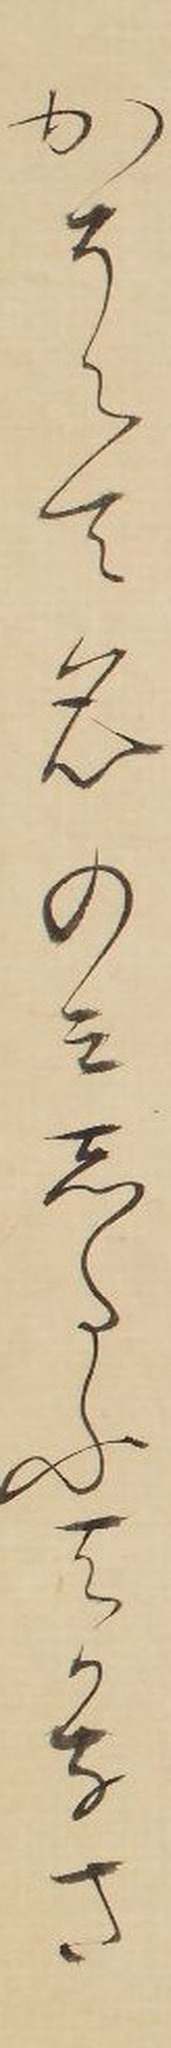かそえて名のみしたふはかなさ

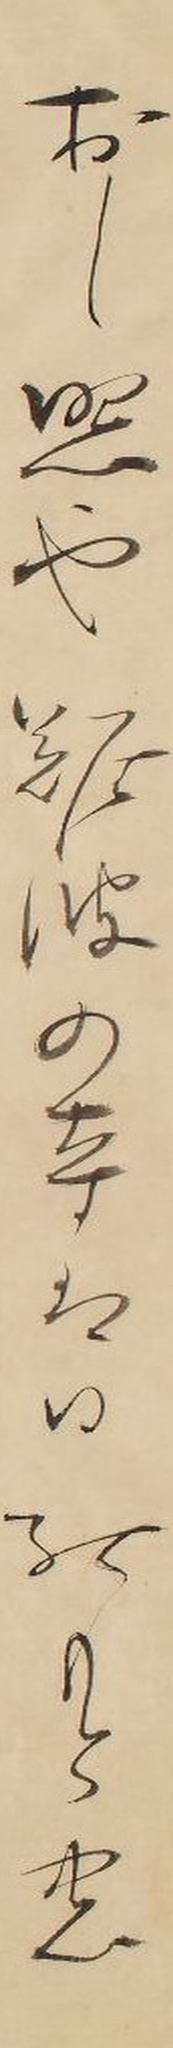おし照や難波の寺は日のもとの
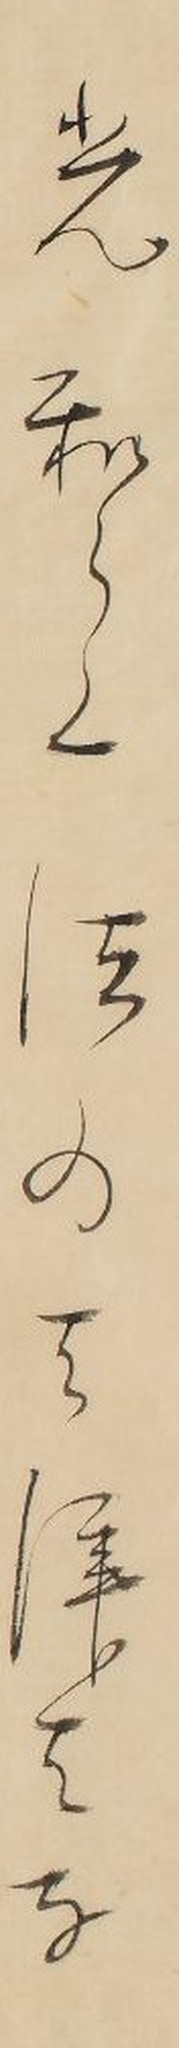光和らく法のはつはな
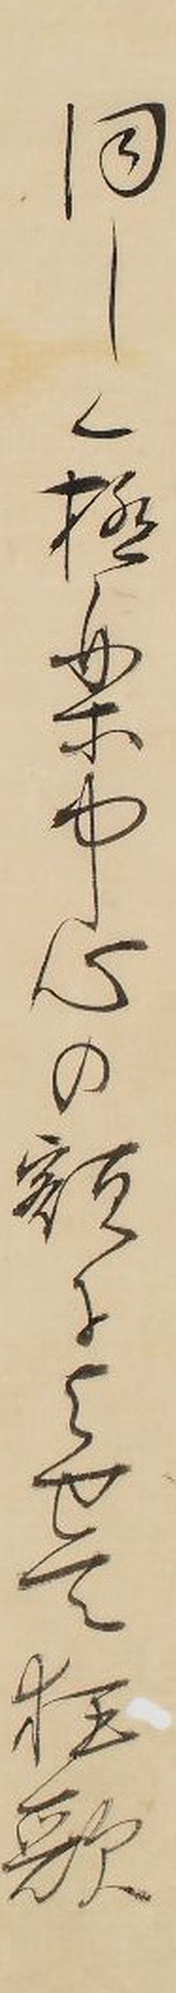同しく極楽中心の額によせて狂歌
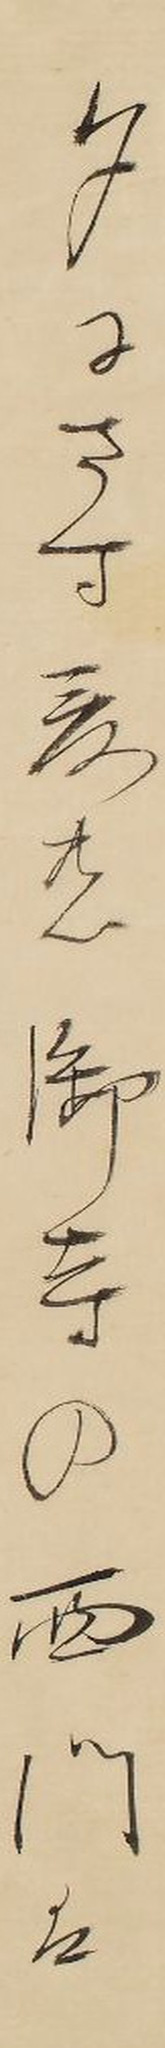夕日さす爰の御寺の西門は
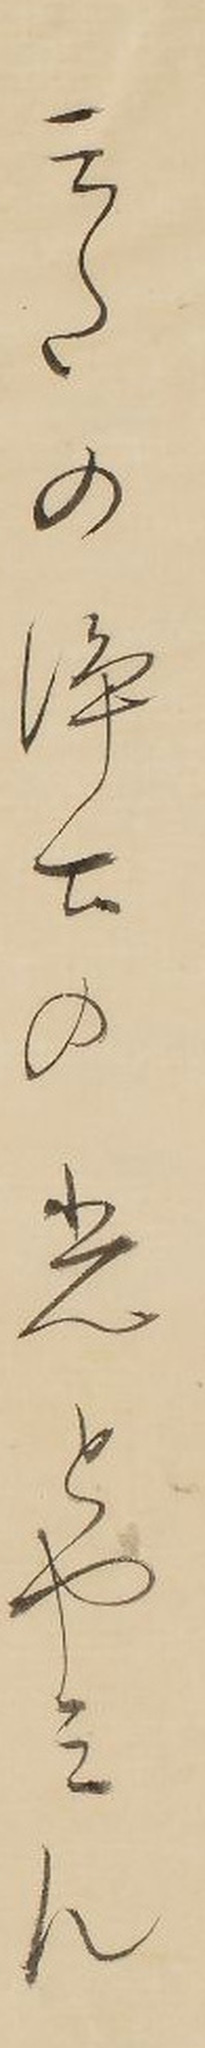みたの浄土の光とやみん
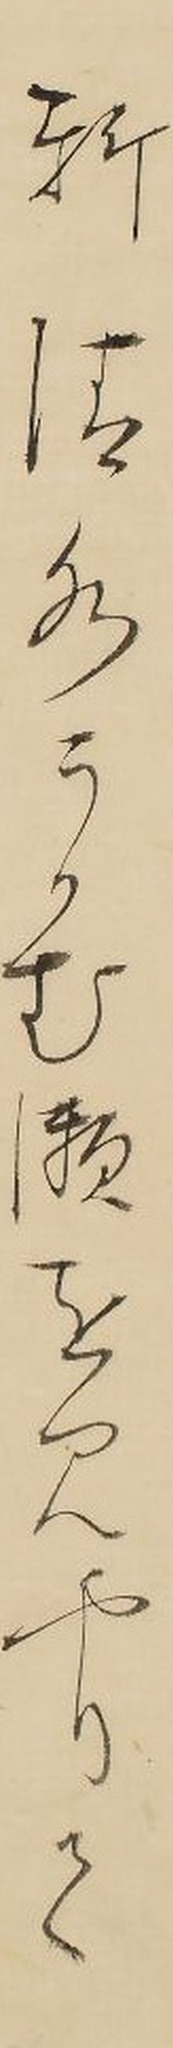新清水うかむ瀬を見やりて
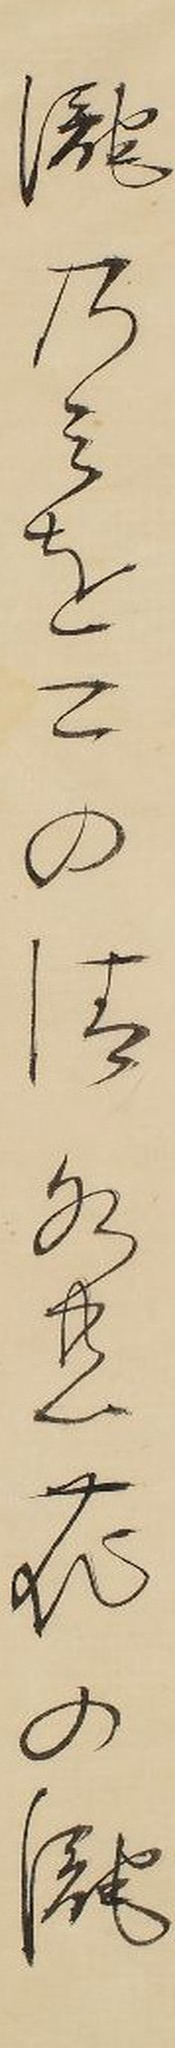瀧のみをこの清水の花の瀧
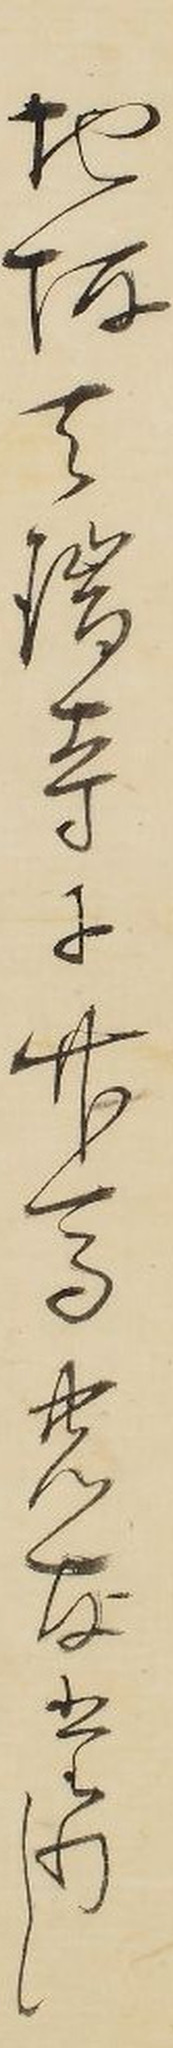地坂天瑞寺に竹馬の友たりし
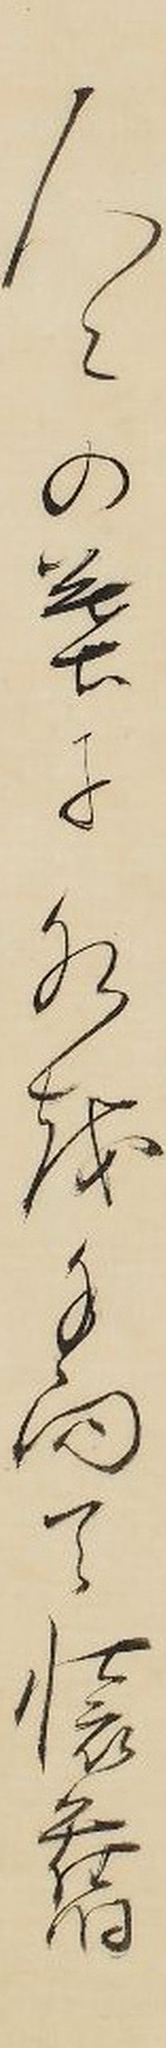人々の墓に水を手向て懐旧
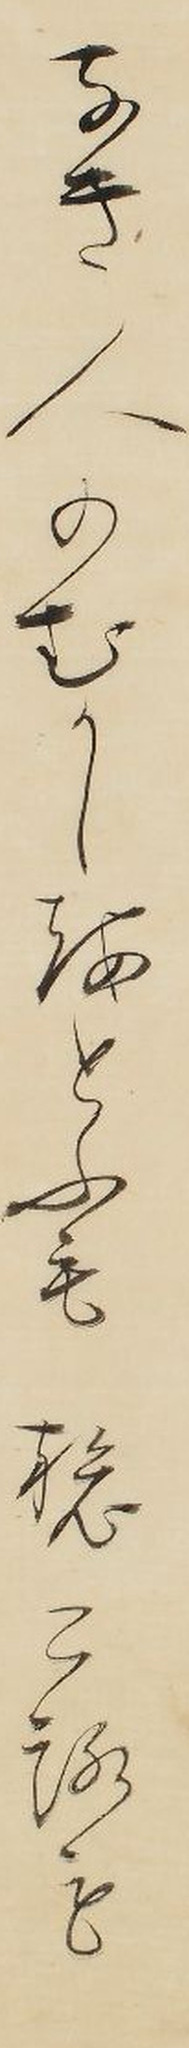なき人のむかしをとふも旅ころも
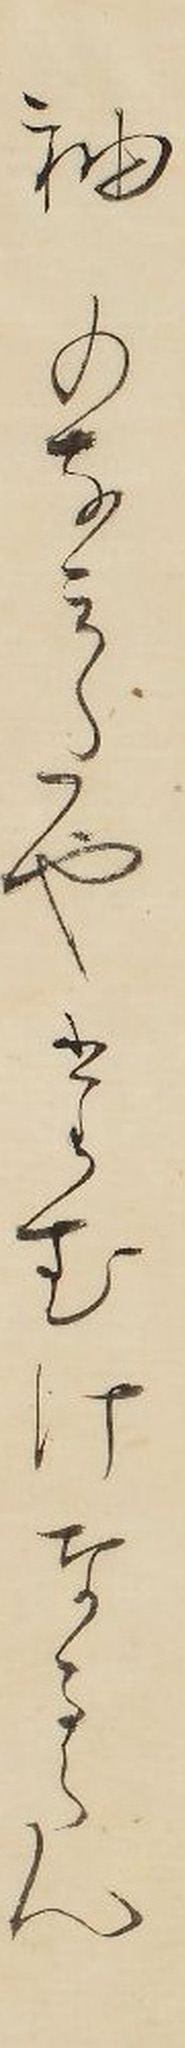袖のなみたやたむけなるらん
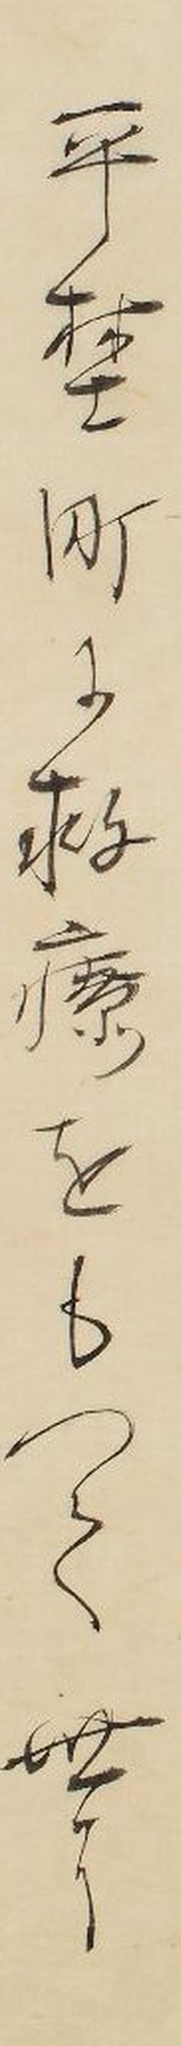平埜町に救療をもつて世に
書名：花土産
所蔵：徳島県立図書館
